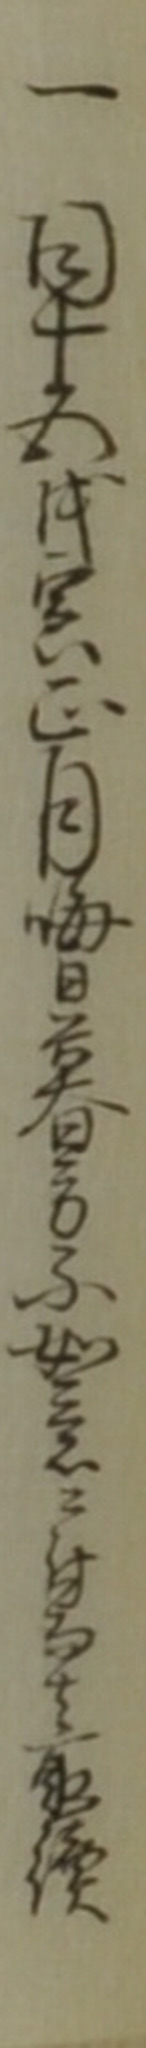一同十五戊寅正月晦日暮方不如意ニ付而者取続
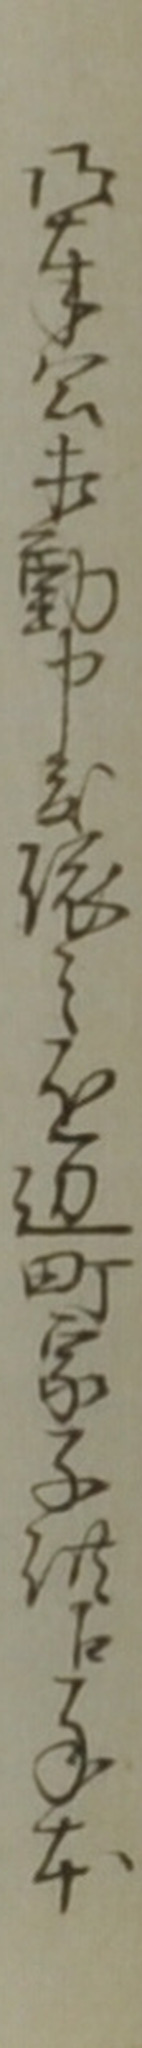御奉公相勤申度依之近辺町家子供江手本
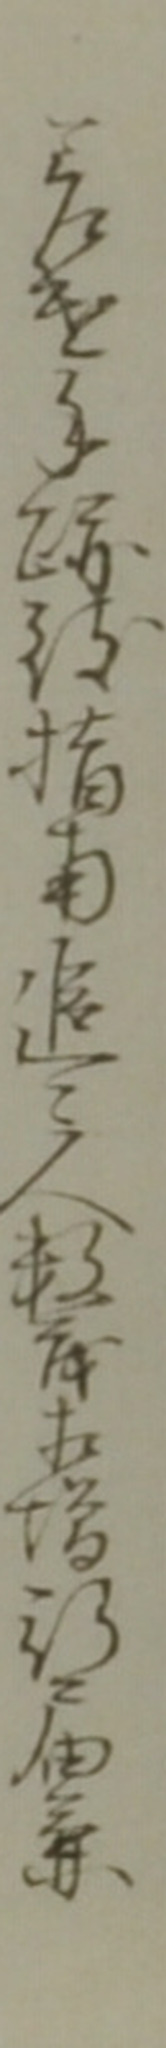差遣手跡致指南追々人数茂相増行届兼
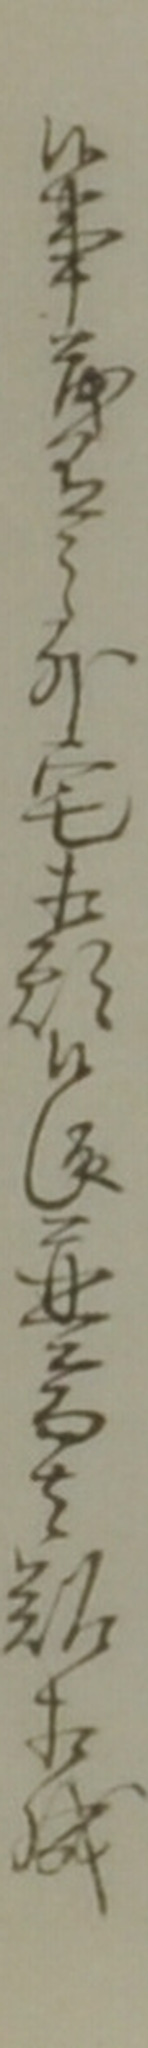候事茂有之外宅相願候趣並ニ而者難相成
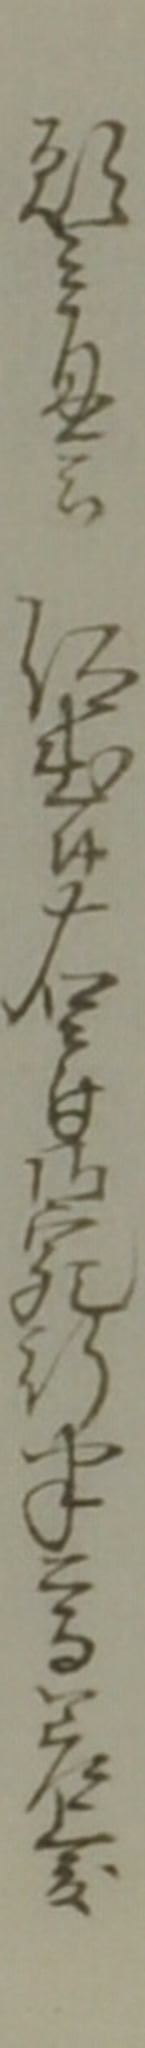願之通被仰出候右ニ付御宛行半高差上度
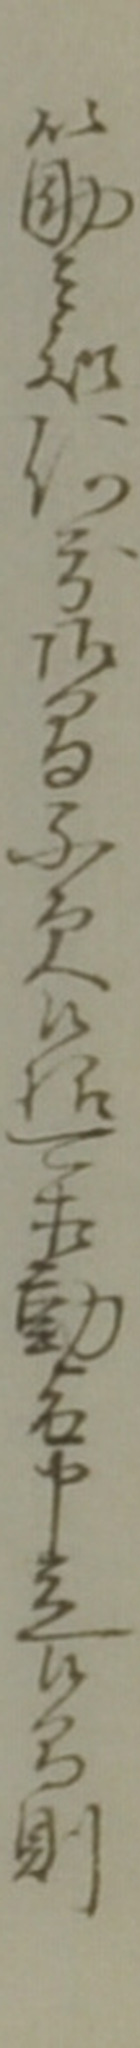筋之処何分御間不受候様可相勤申立候間則
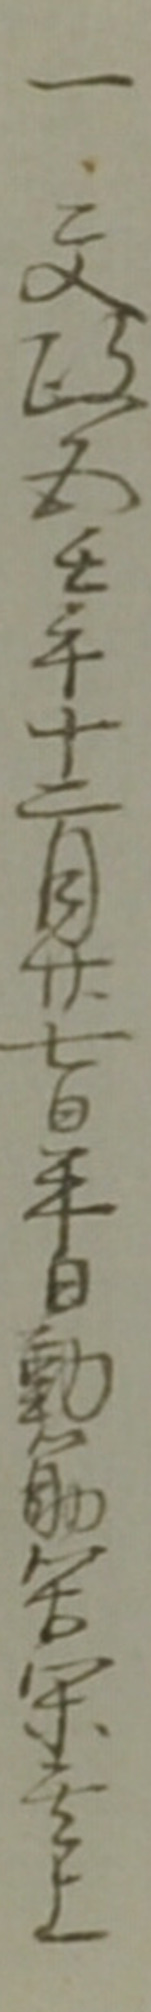一文政五壬午十二月廿七日平日勤筋等閑其上
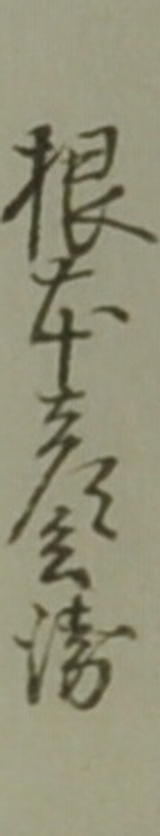根本彦兵衛

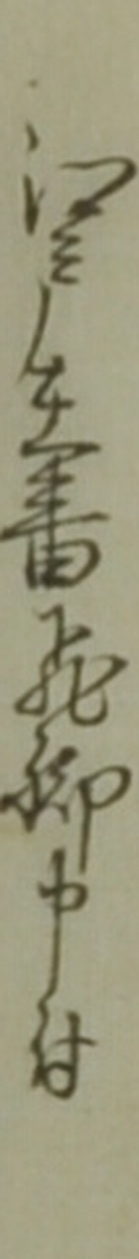江戸在番飛脚申付
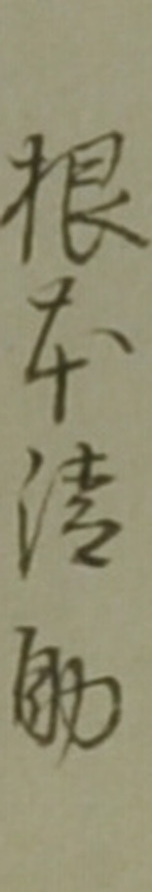根本清助
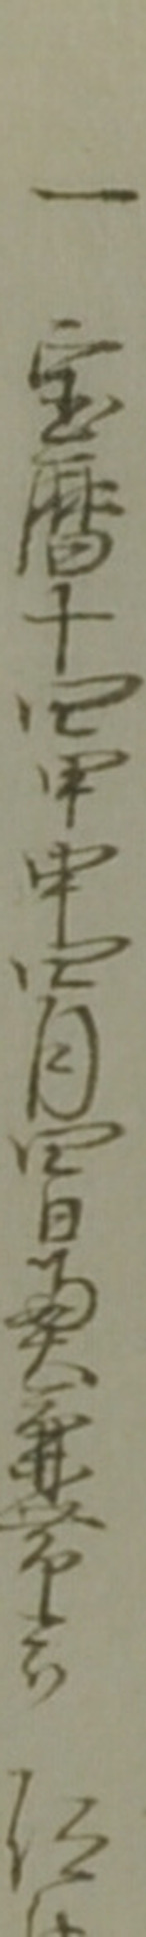一宝暦十四甲申四月四日奥兼帯被仰付
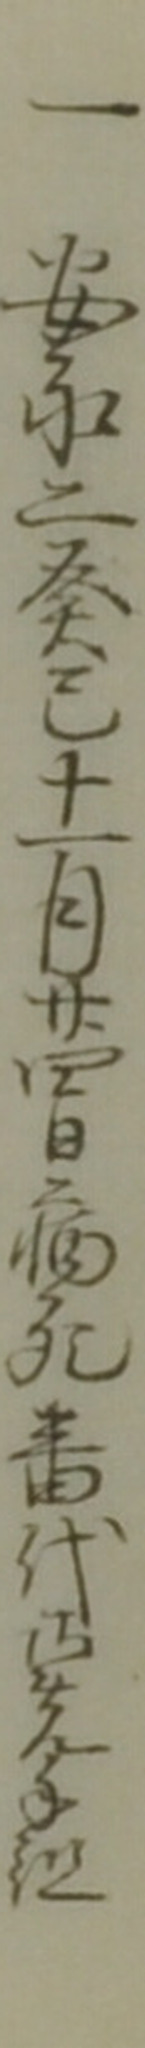一安永ニ癸巳十一月廿四日病死番代御先手組
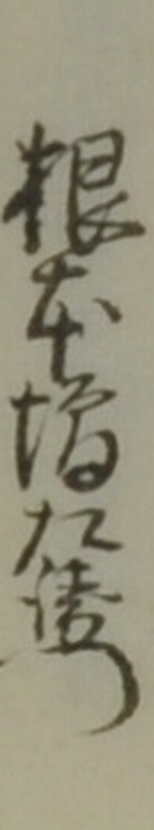根本増左衛門
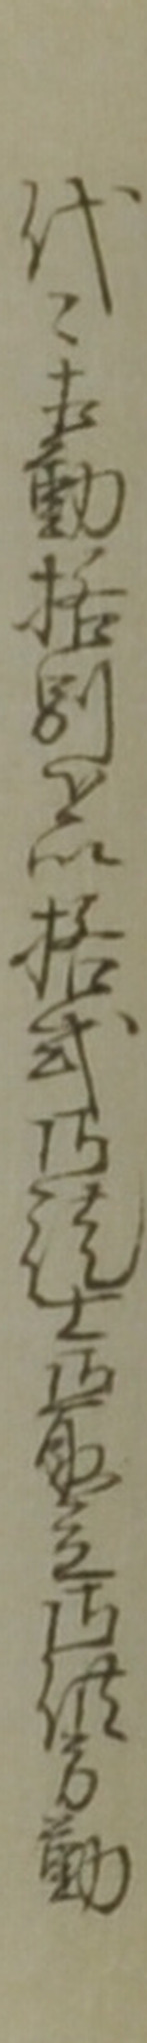代々相勤格別を以格式御徒士御取立御供方勤

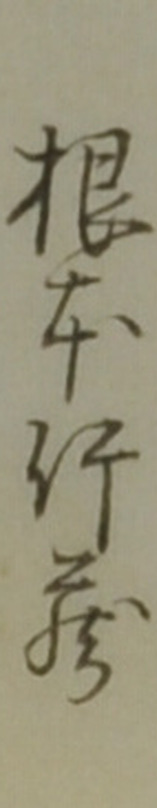根本竹蔵

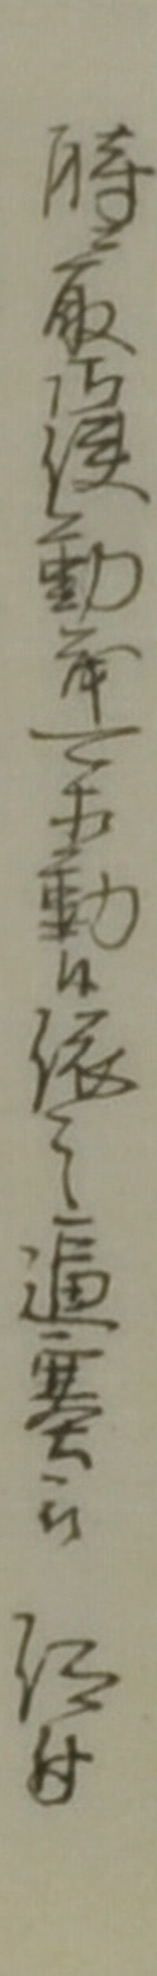時取御使勤茂可相勤候依之逼塞被仰付
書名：無足廃家（弐）
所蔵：伊那市立高遠町図書館・合同会社AMANE
